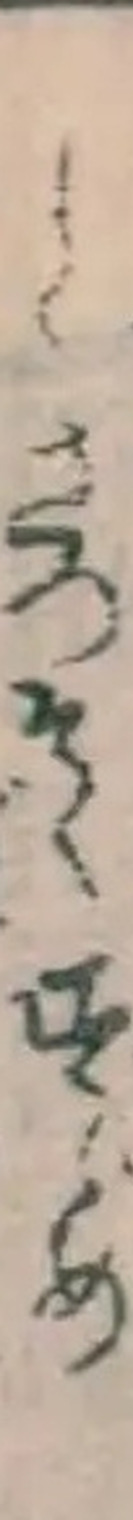しくさつそくすゞめ
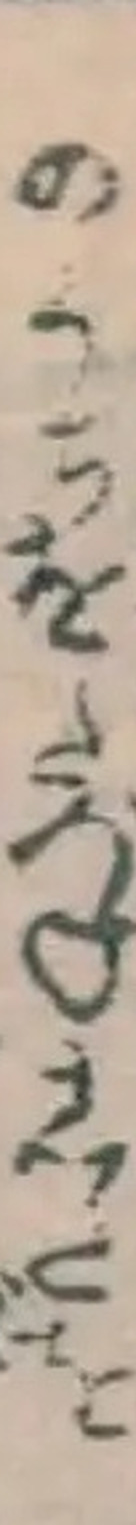のうちをたづねしたを
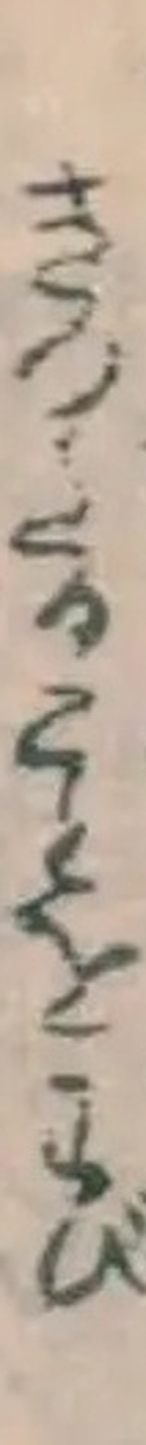きりたることをわび
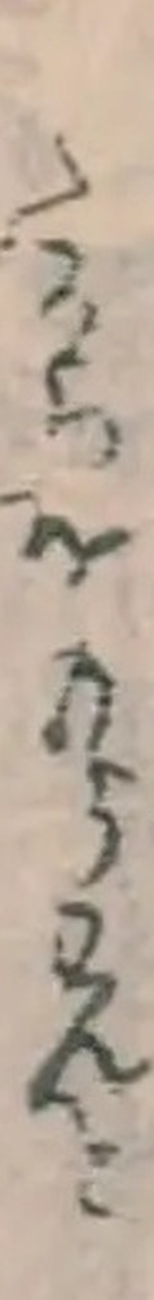たからをもらわんと
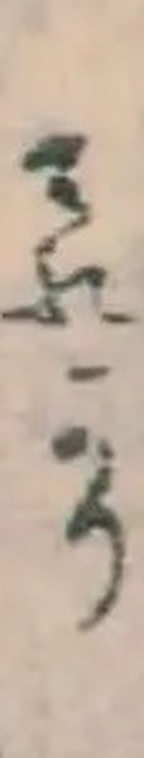これより
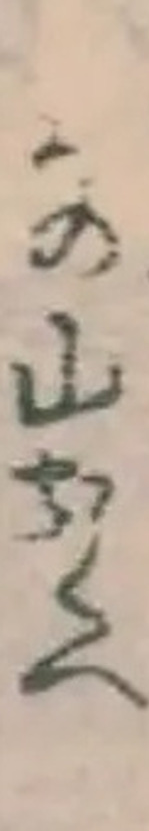かの山おくへ
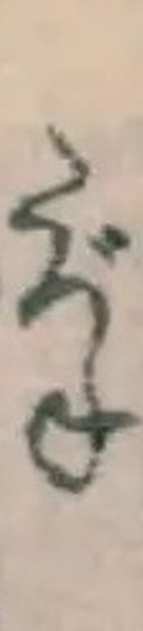たづね
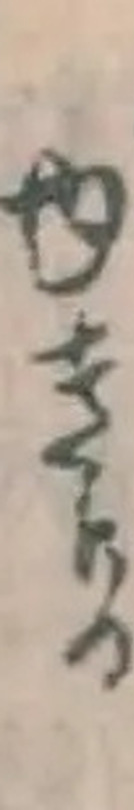ゆきける

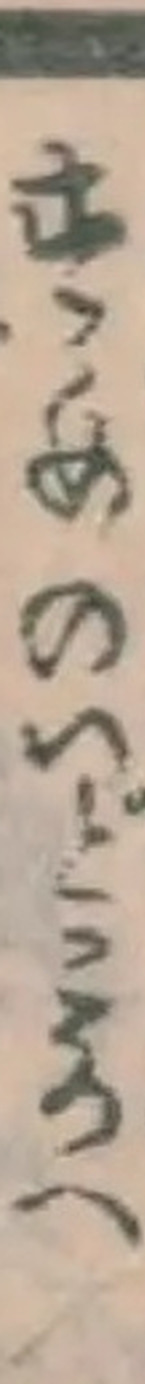すゝめのいどころへ
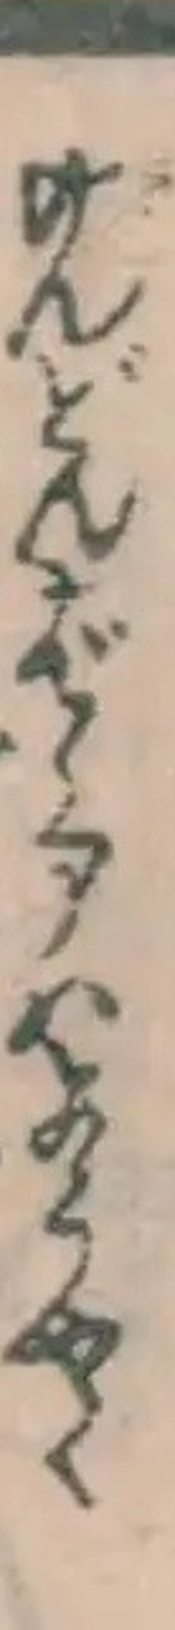けんどんばゝあはようやく
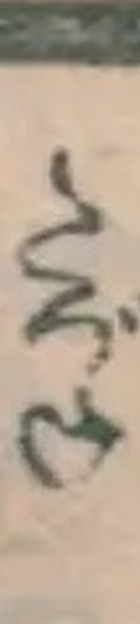たづね
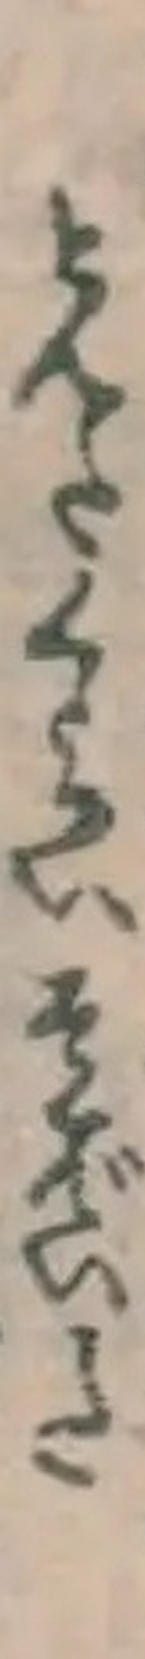とんとくらいそばいた
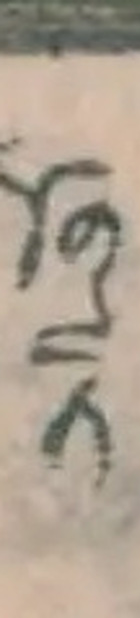あたり
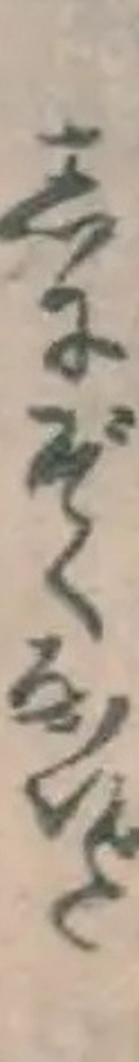しにぞくないど
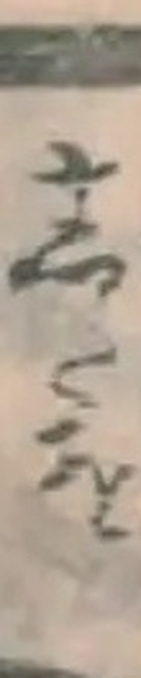したを
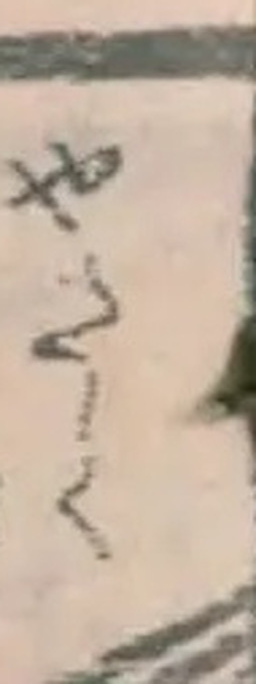やさしく
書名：舌切雀
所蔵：国立国会図書館 National Diet Library, JAPAN
